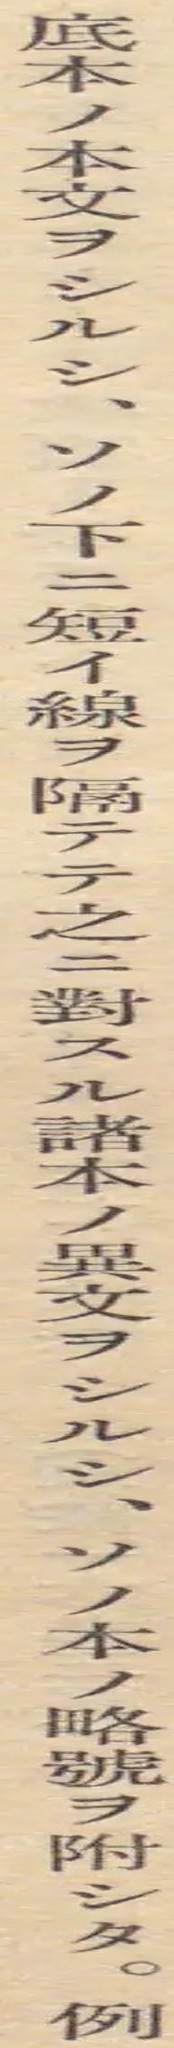底本ノ本文ヲシルシ、ソノ下ニ短イ線ヲ隔テテ之ニ対スル諸本ノ異文ヲシルシ、ソノ本ノ略号ヲ附シタ。例
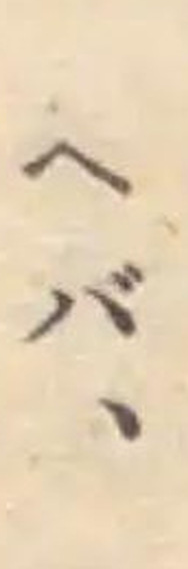ヘバ、
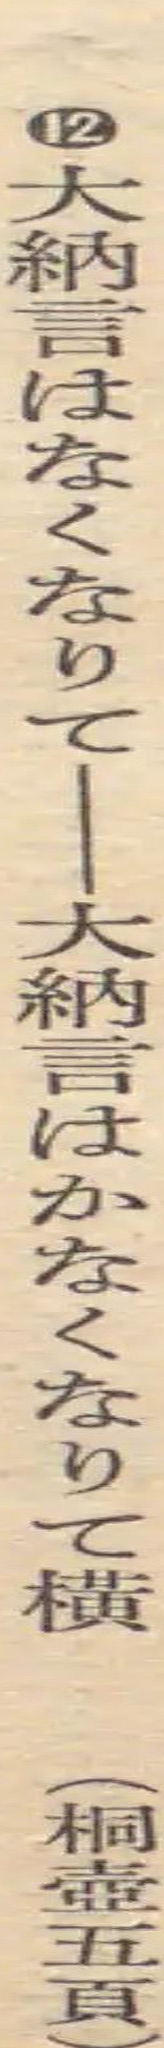⓬大納言はなくなりて──大納言はかなくなりて横(桐壺五頁)
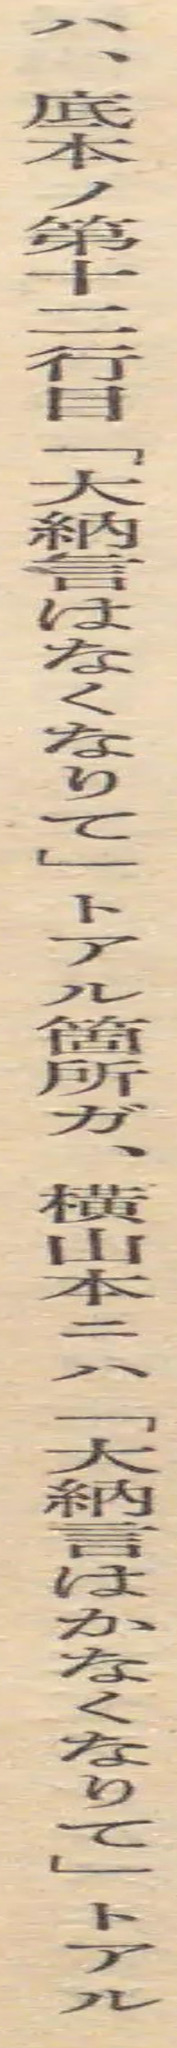ハ、底本ノ第十二行目「大納言はなくなりて」トアル箇所ガ、横山本ニハ「大納言はかなくなりて」トアル
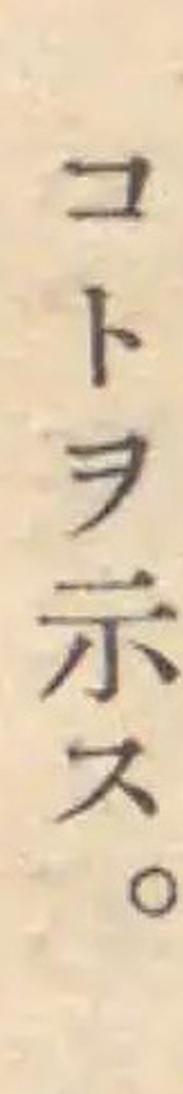コトヲ示ス。
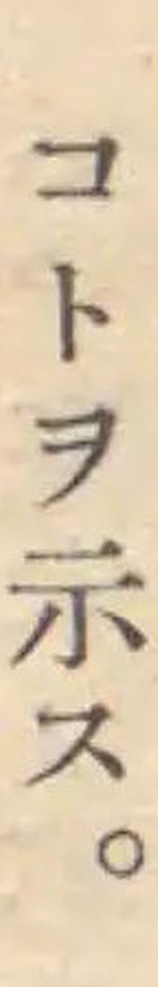コトヲ示ス。
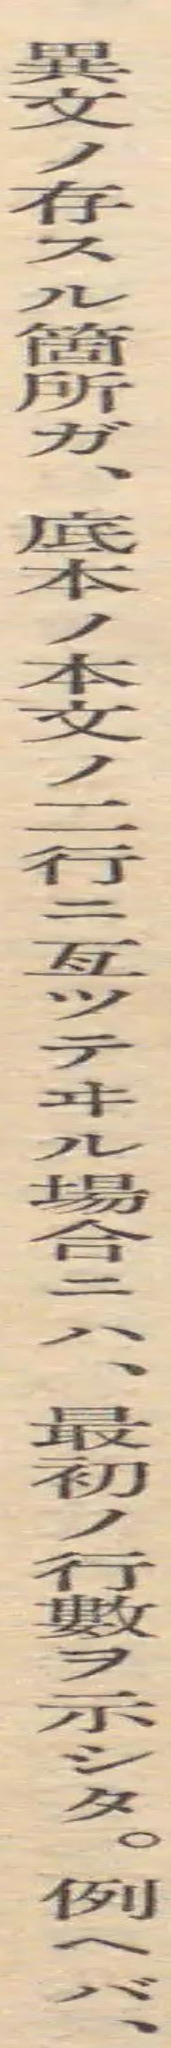一異文ノ存スル箇所ガ、底本ノ本文ノ二行ニ亘ツテヰル場合ニハ、最初ノ行数ヲ示シタ。例ヘバ、
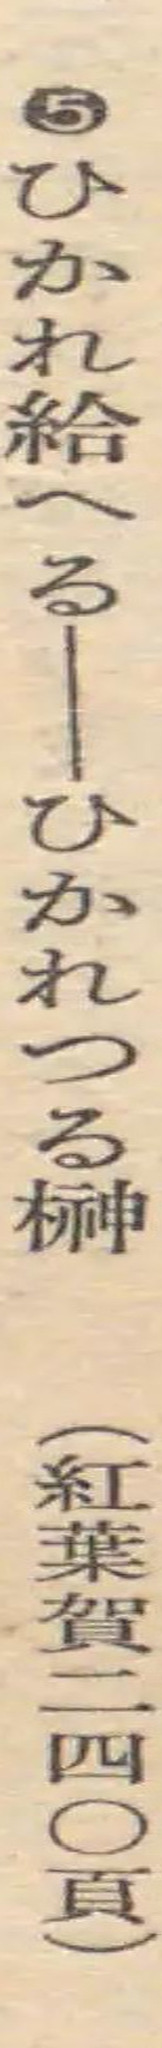❺ひかれ給へる──ひかれつる榊(紅葉賀二四〇頁)
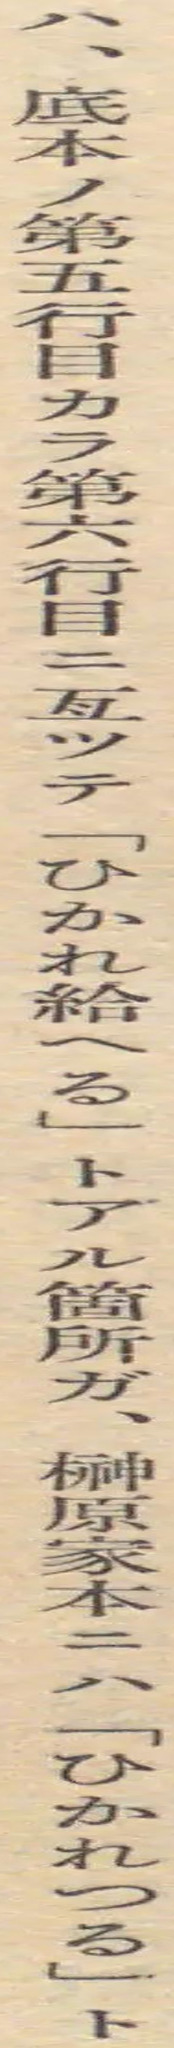ハ、底本ノ第五行目カラ第六行目ニ亘ツテ「ひかれ給へる」トアル箇所ガ、榊原家本ニハ「ひかれつる」ト
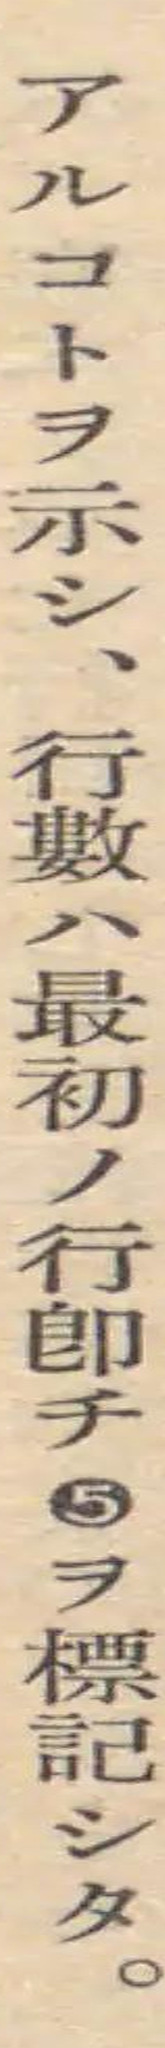アルコトヲ示シ、行数ハ最初ノ行即チ❺ヲ標記シタ。
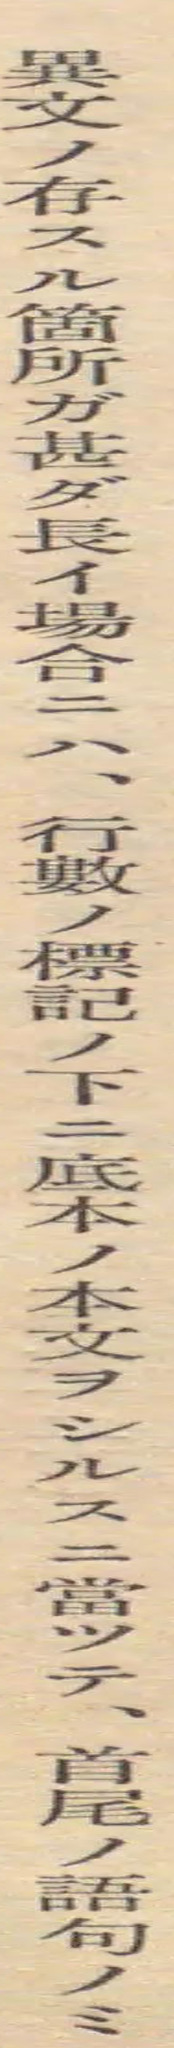一異文ノ存スル箇所ガ甚ダ長イ場合ニハ、行数ノ標記ノ下ニ底本ノ本文ヲシルスニ当ツテ、首尾ノ語句ノミ
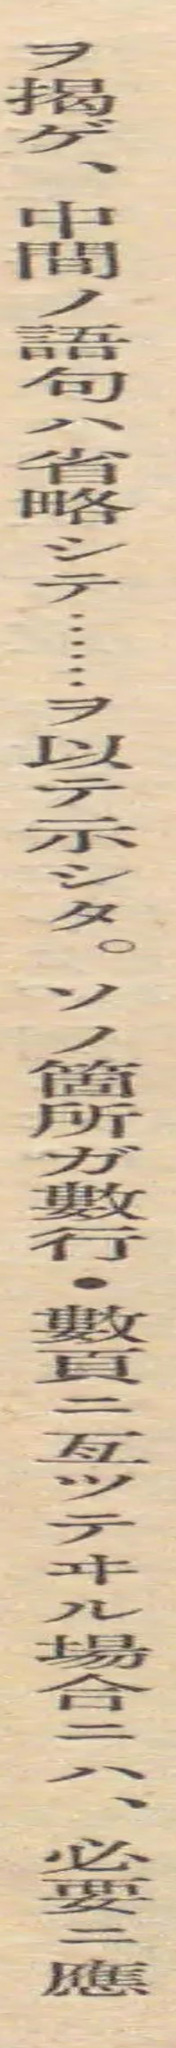ヲ掲ゲ、中間ノ語句ハ省略シテ……ヲ以テ示シタ。ソノ箇所ガ数行・数頁ニ亘ツテヰル場合ニハ、必要ニ応

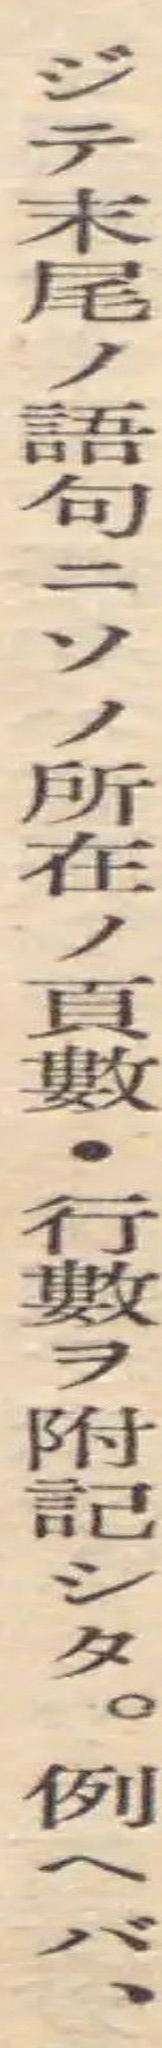ジデ末尾ノ語句ニソノ所在ノ頁数・行数ヲ附記シタ。例ヘバ、
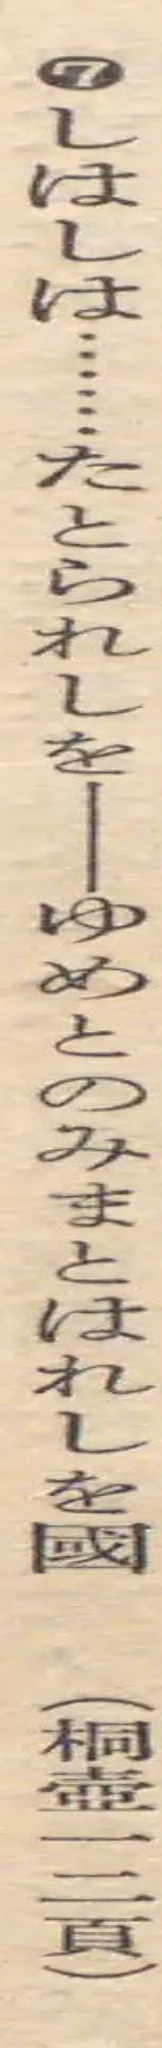➐しはしは……たとられしを──ゆめとのみまとはれしを国(桐壺一二頁)
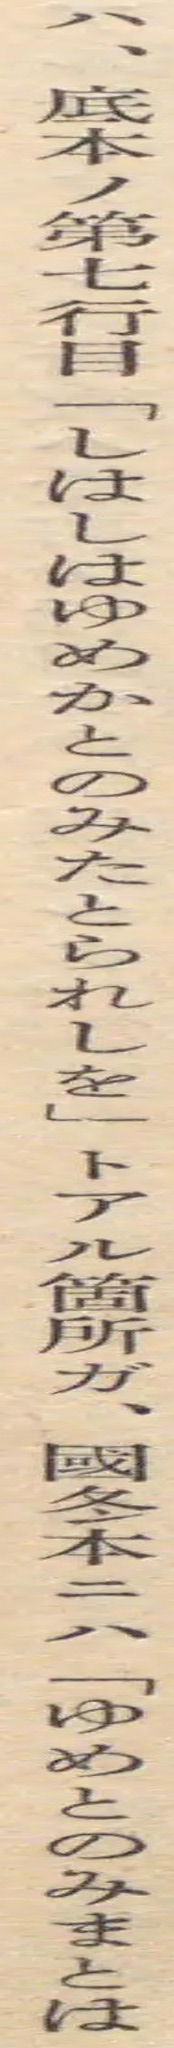ハ、底本ノ第七行目「しはしはゆめかとのみたとられしを」トアル箇所ガ、国冬本ニハ「ゆめとのみまとは
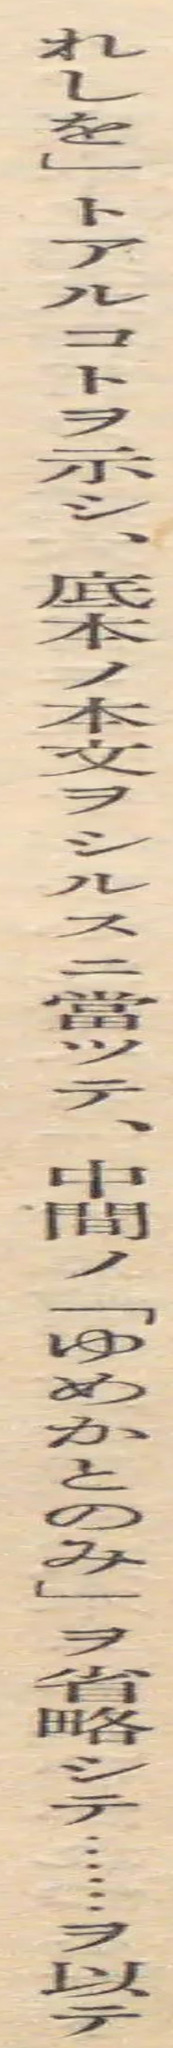れしを」トアルコトヲ示シ、底本ノ本文ヲシルスニ当ツテ、中間ノ「ゆめかとのみ」ヲ省略シテ……ヲ似テ
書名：校異源氏物語.
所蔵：国立国会図書館 National Diet Library, JAPAN
